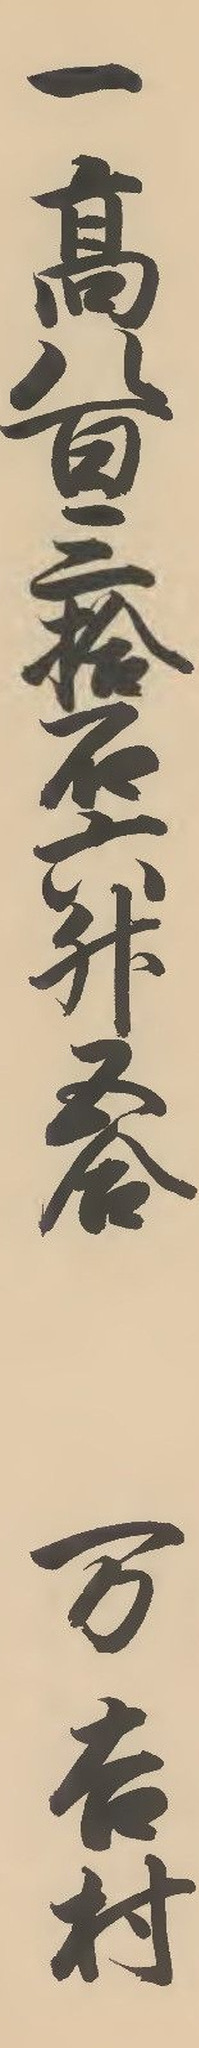一高八百三拾石六升五合万吉村
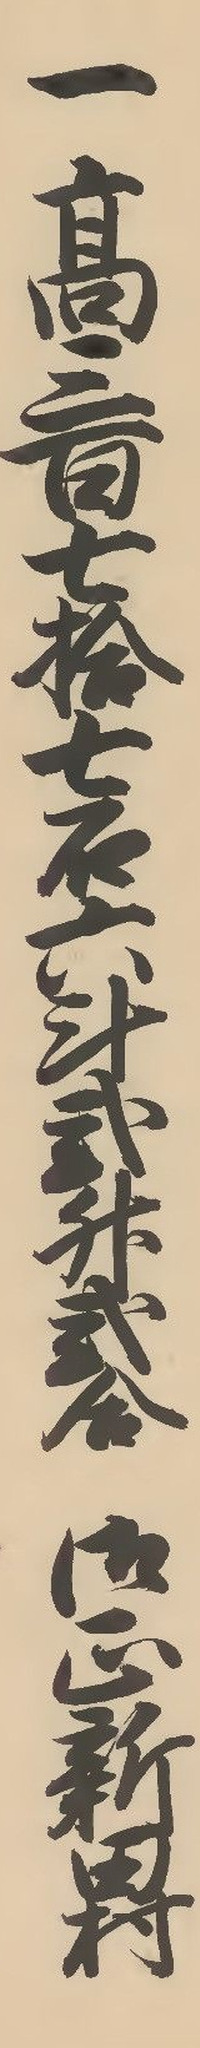一高三百七拾七石六斗弐升弐合御正新田村

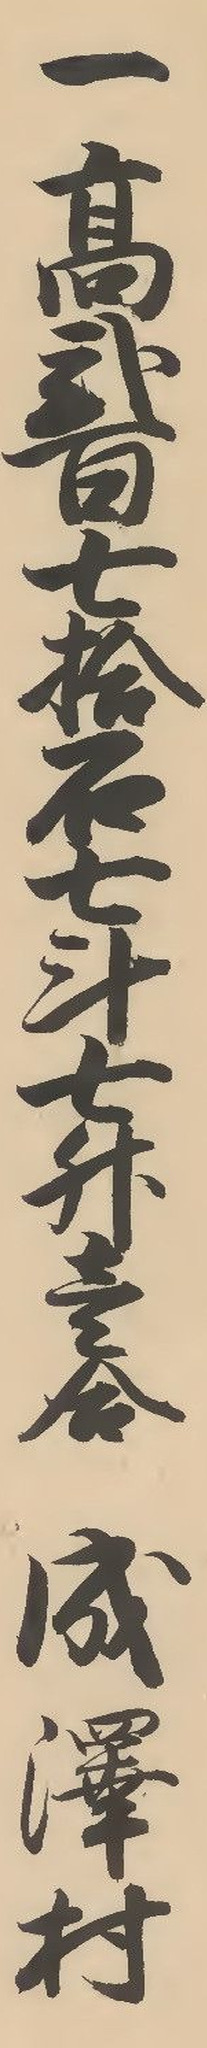一高弐百七拾石七斗七升壱合成澤村
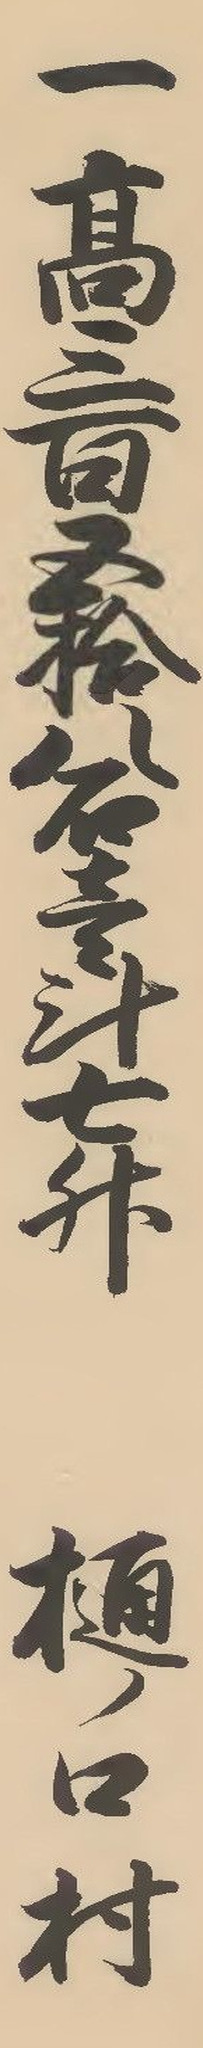一高三百五拾八石壱斗七升樋ノ口村
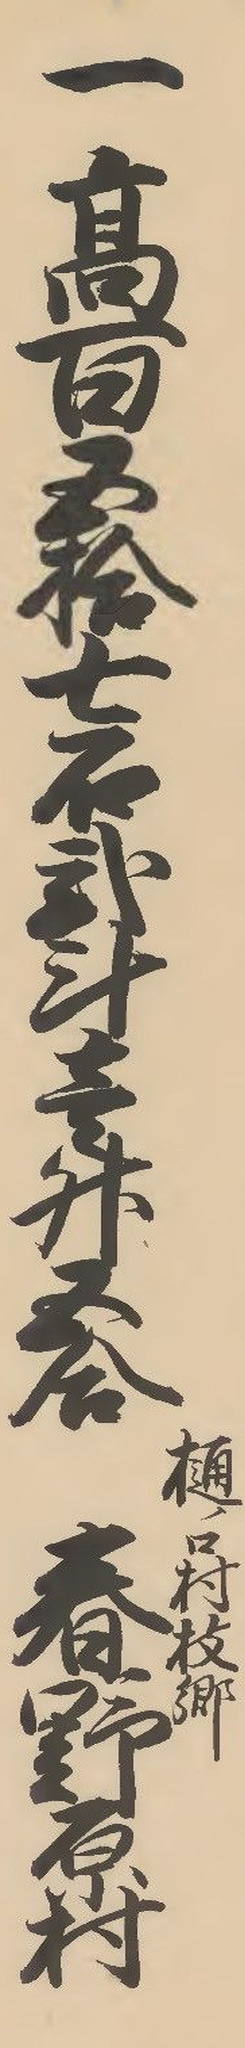一高百五拾七石弐斗壱升五合春野原村
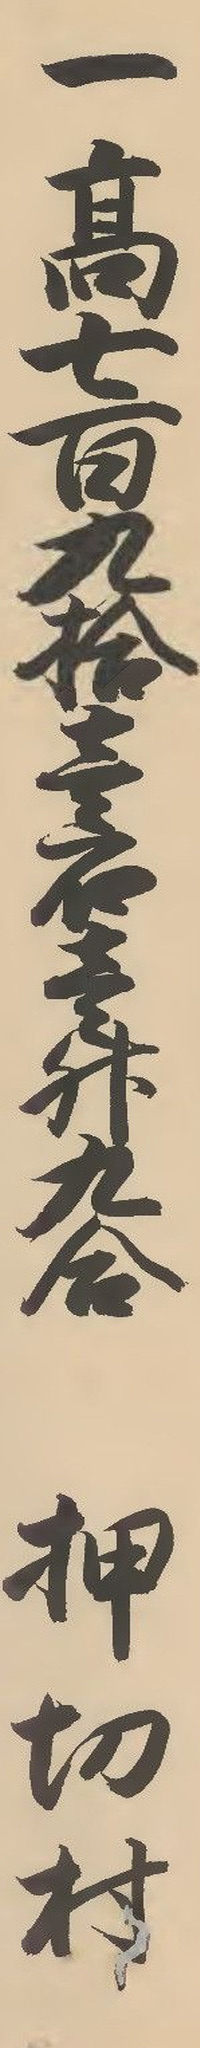一高七百九拾壱石壱升九合押切村
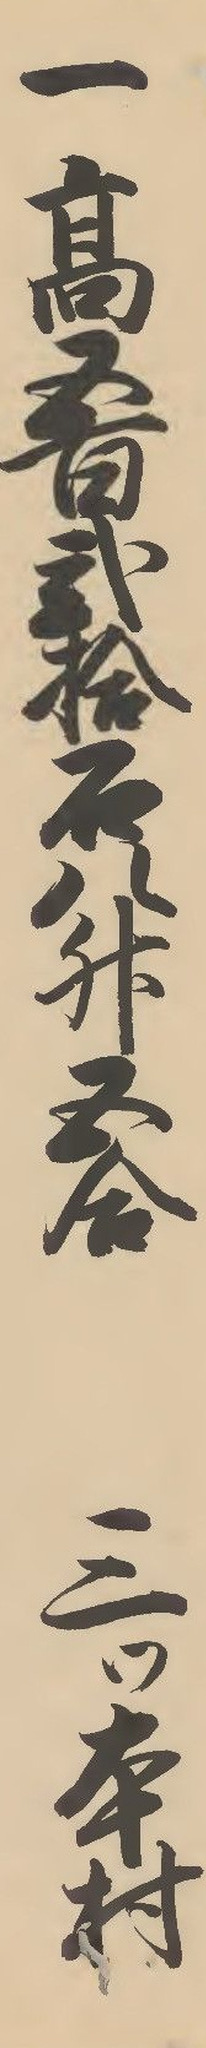一高五百弐拾石八升五合三ッ本村
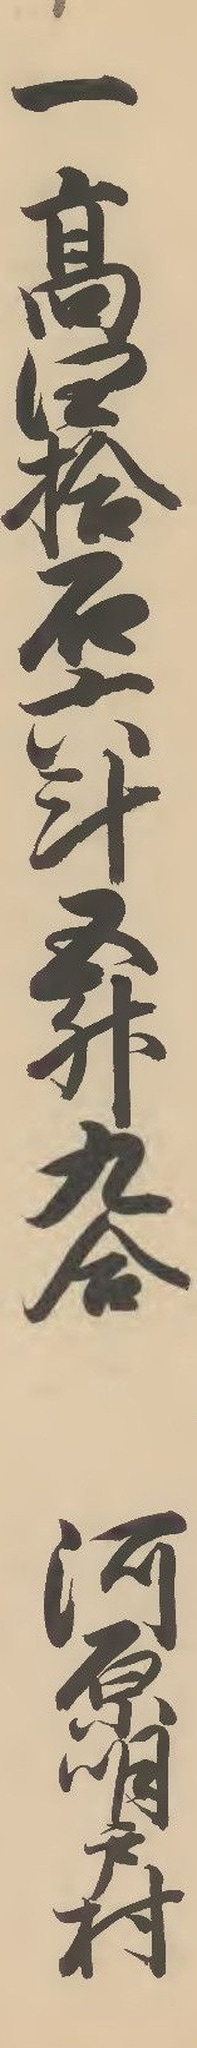一高四拾石六斗五升九合河原明戸村
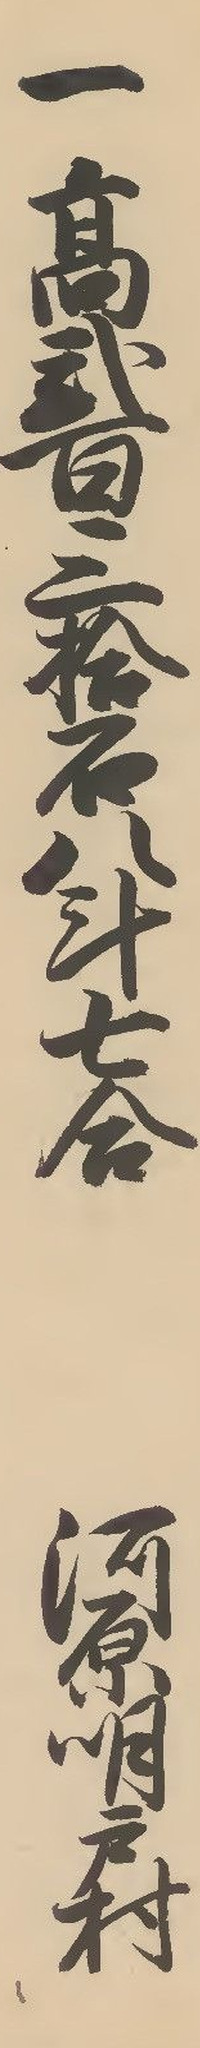一高弐百三拾石八斗七合河原明戸村
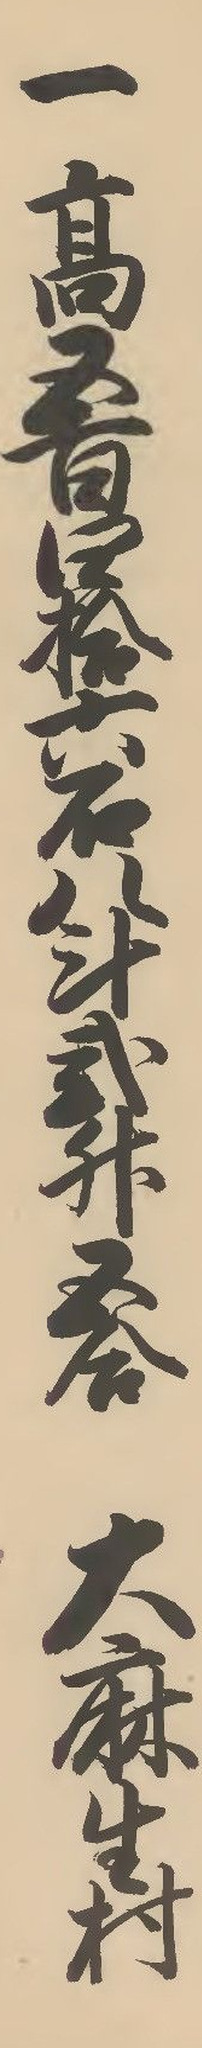一高五百四拾六石八斗弐升五合大麻生村

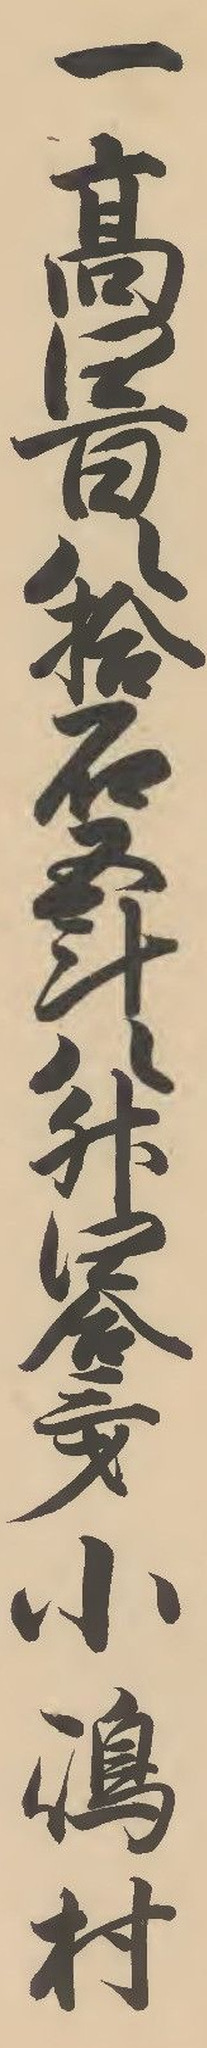一高四百八拾石五斗八升四合三才小嶋村
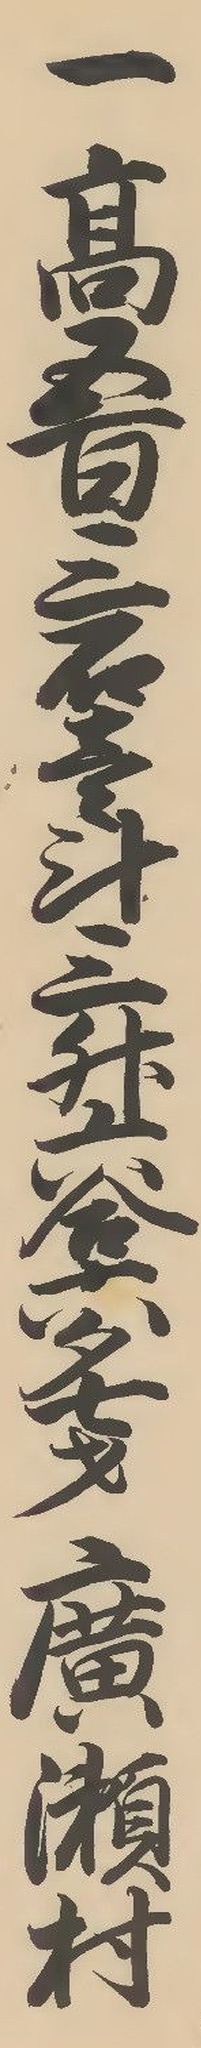一高五百三石壱斗三升六合六勺七才広瀬村
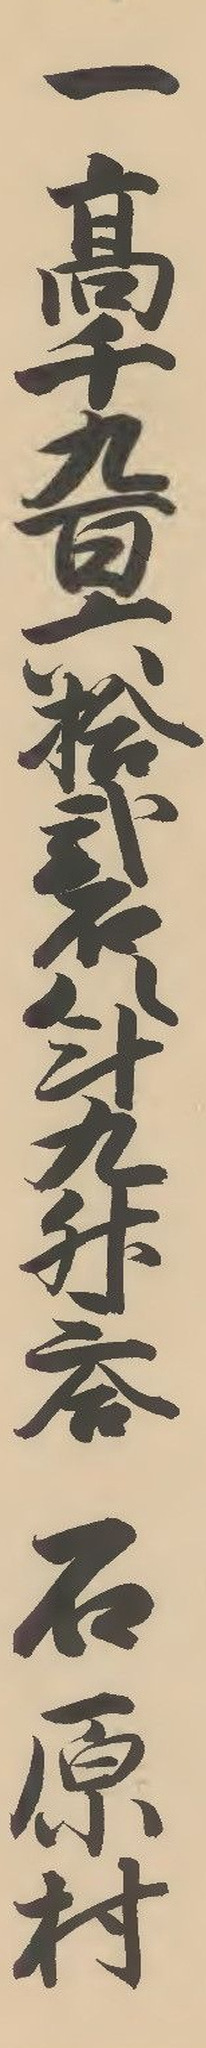一高千九百六拾弐石八斗九升三合石原村
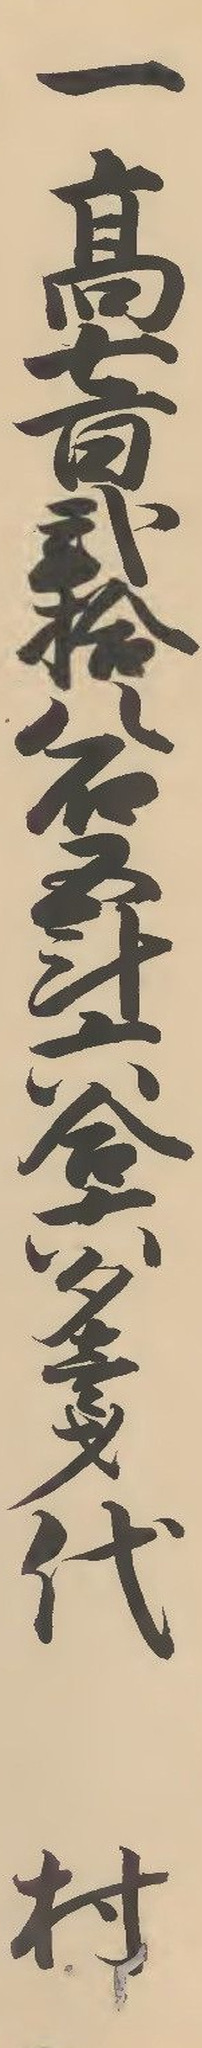一高七百弐拾八石五斗六合六夕壱才代村
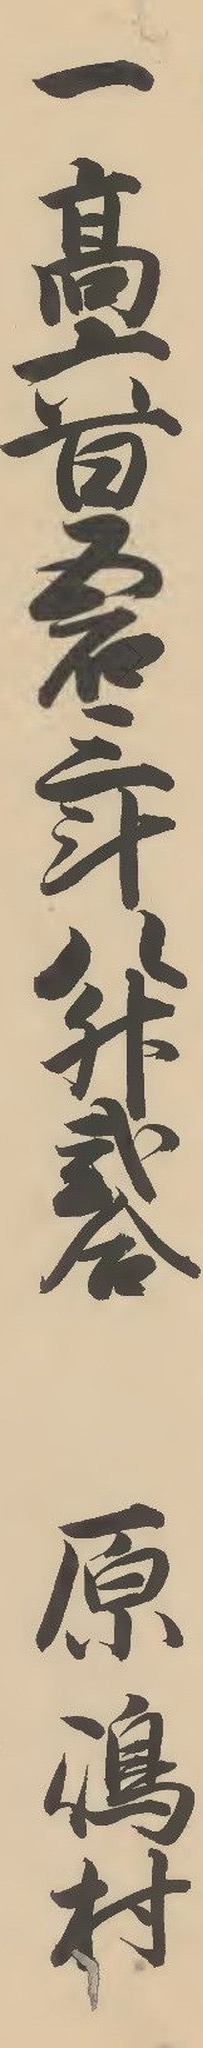一高六百五石三斗八升弐合原嶋村
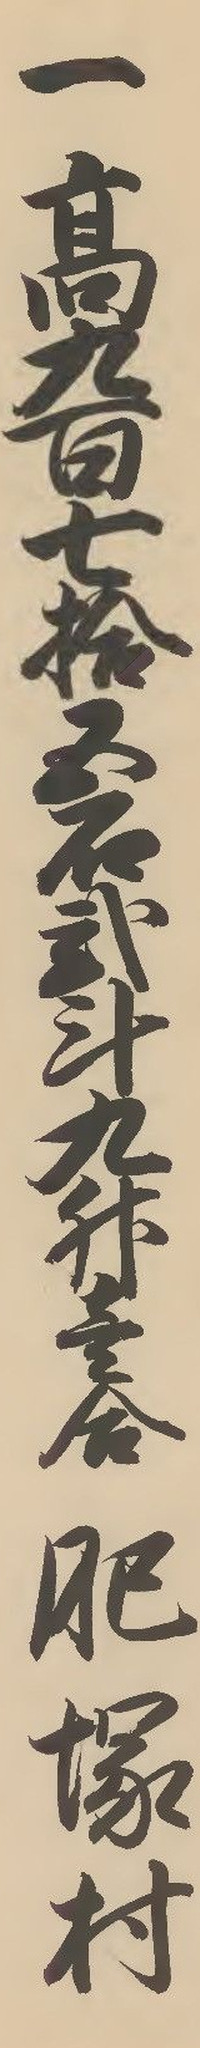一高九百七拾五石弐斗九升壱合肥塚村
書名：武蔵国郷帳　上
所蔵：国立公文書館 National Archives of Japan
